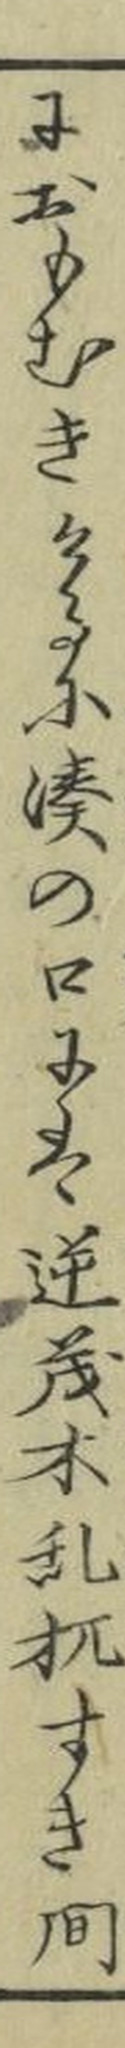におもむきけるに、湊の口には逆茂木乱杭すき間
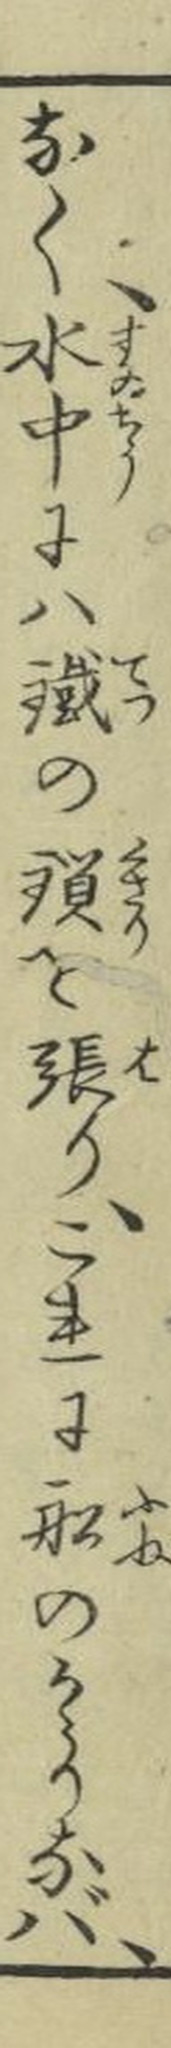なく、水中には鉄の鎖を張り、これに船のかゝりなば、
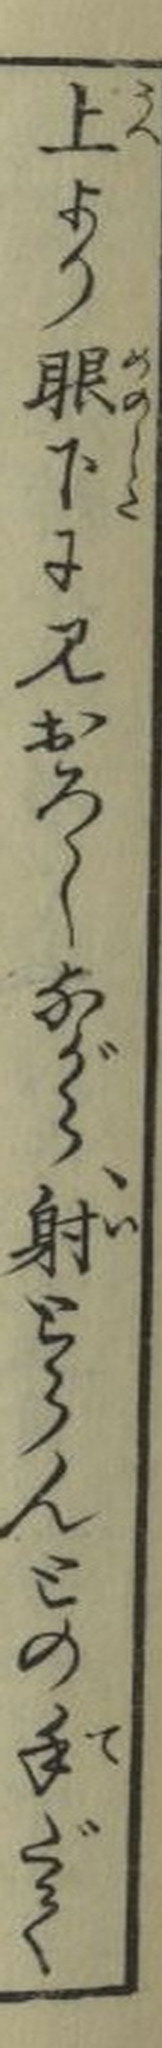上より眼下に見おろしながら、射とらんとの手だて
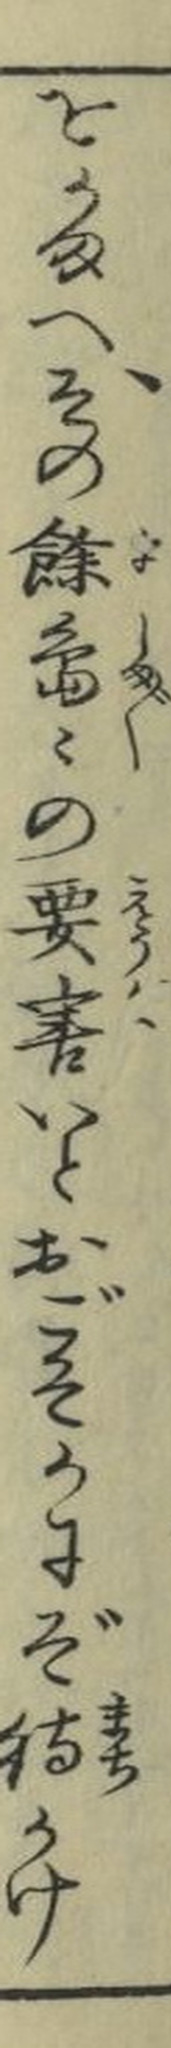をかまへ、その余島々の要害いとおごそかにぞ待かけ
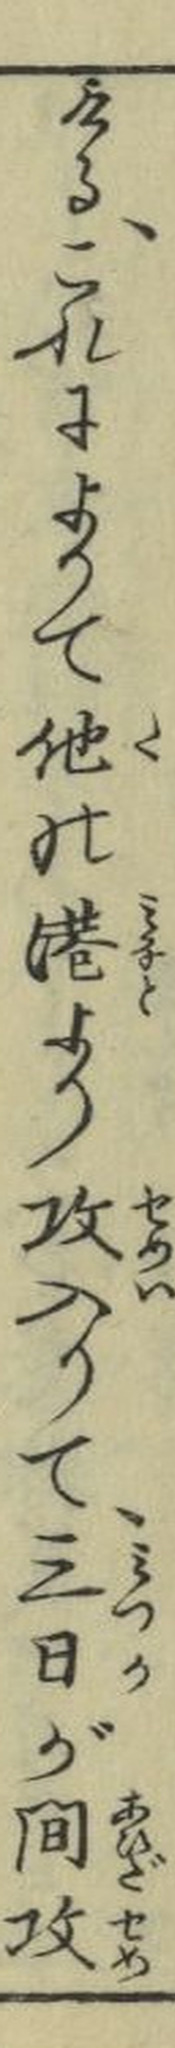ける、これによりて他の港より攻入りて、三日が間攻
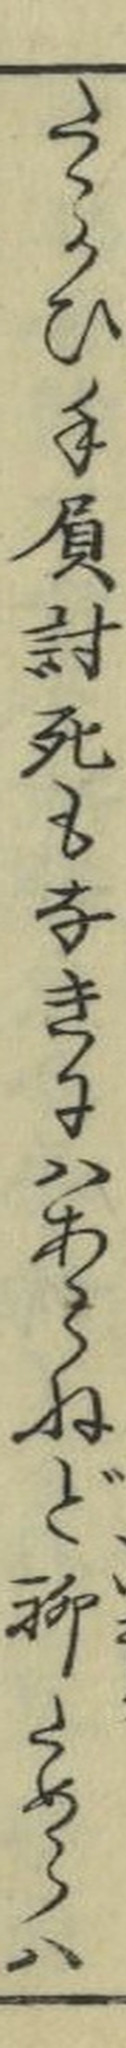たゝかひ、手負討死もなきにはあらねど、聊ためらは
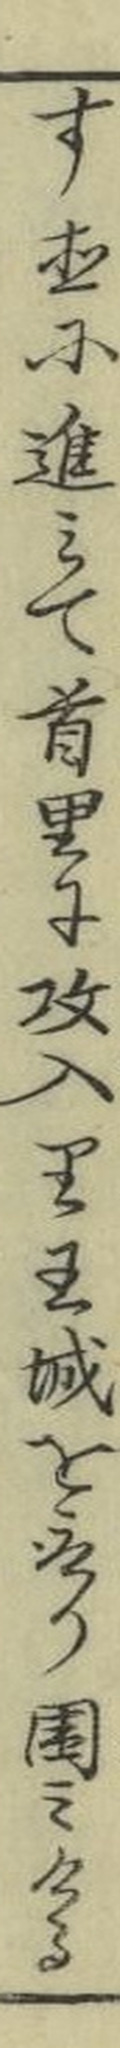ず直に進みて、首里に攻入り、王城を取り囲みける
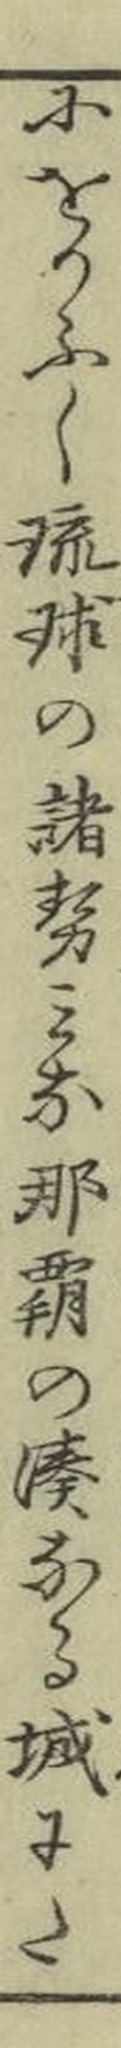に、をりふく琉球の諸勢、みな那覇の湊なる城にた
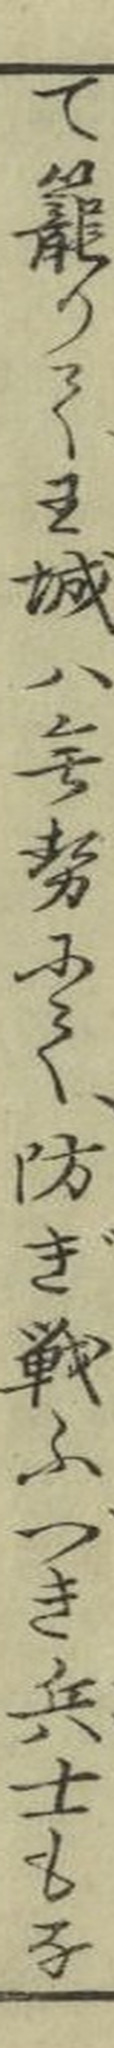て籠りて、王城は無勢にて、防ぎ戦ふべき兵士もな
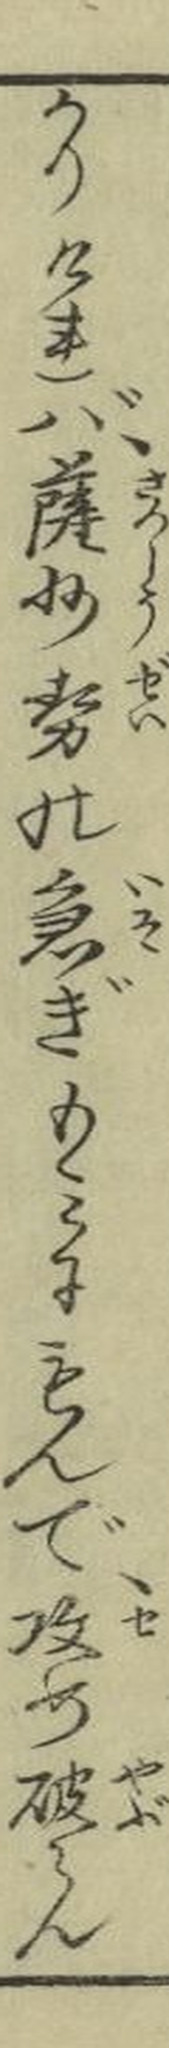かりければ、薩州勢の急ぎもみにもんで、攻め破らん
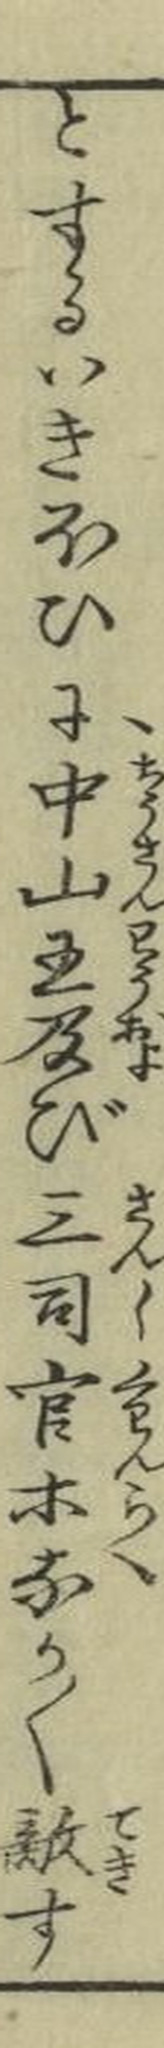とするいきほひに、中山王及び三司官等、なか〳〵敵す

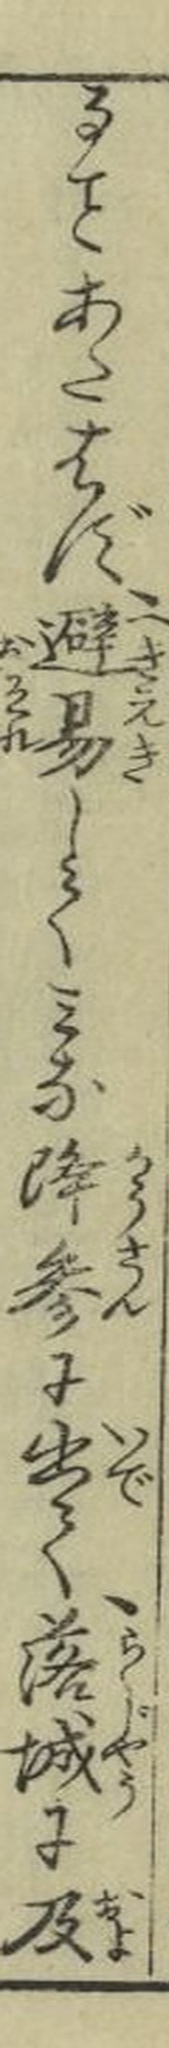ることあたはず、避易してみな降参に出て、落城に及
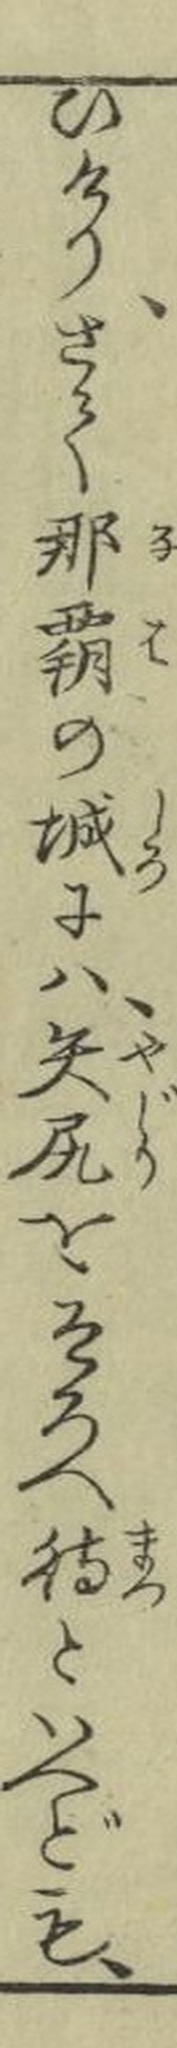ひけり、さて那覇の城には矢尻をそろへ待といへども、
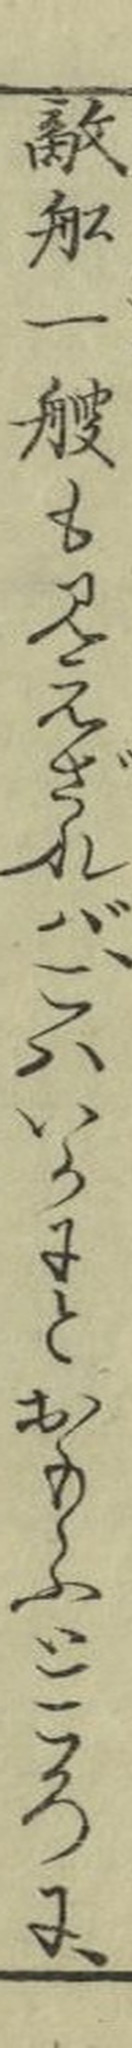敵船一艘も見えざれば、こはいかにとおもふところに、
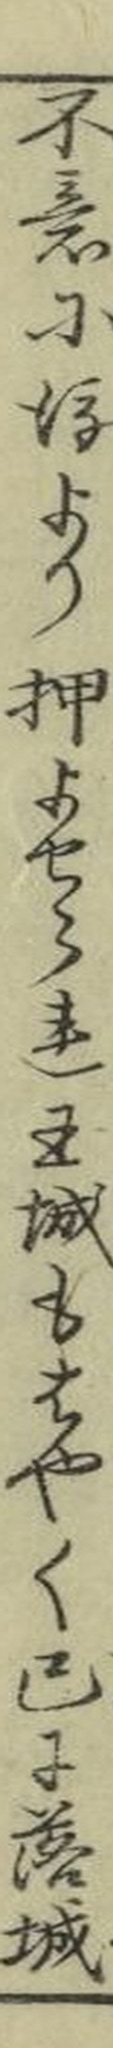不意に後より押よせられ、王城もはやく已に落城
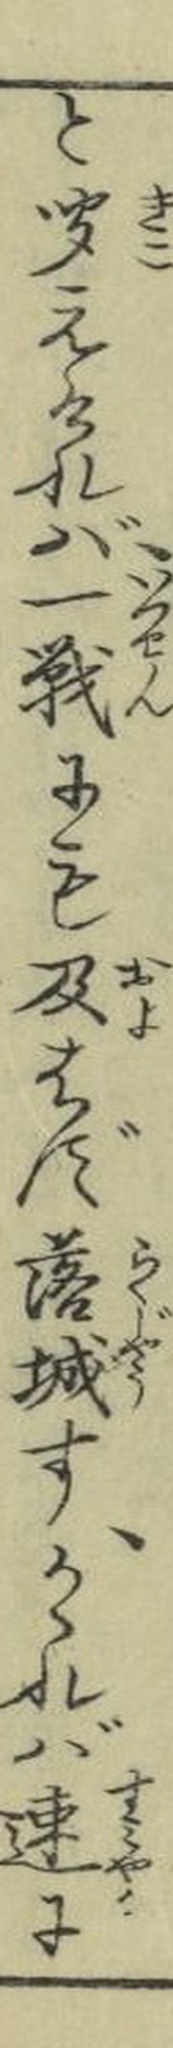と聞えければ、一戦にも及はず落城す、かゝれば速に
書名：琉球入貢紀略
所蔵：University of the Ryukyus Library
